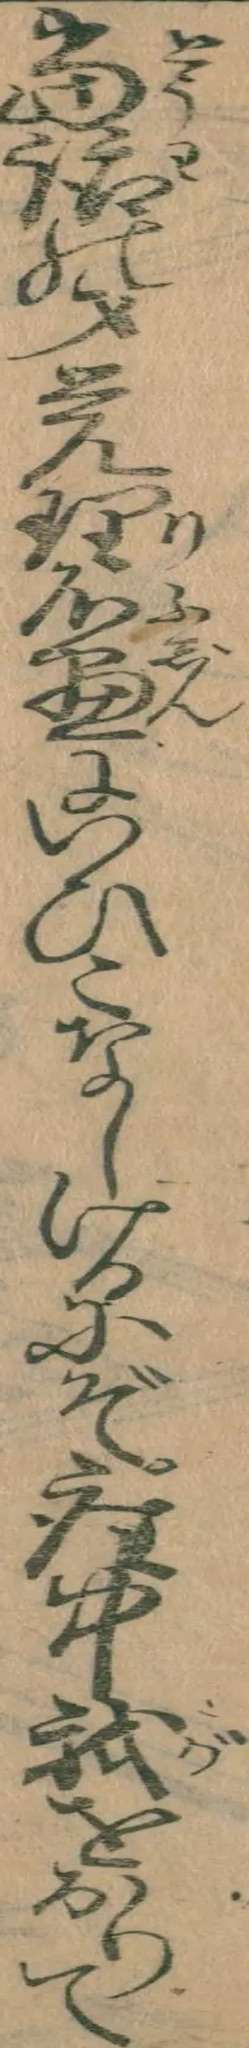当話の才覚理不尽にいひこなしけるにぞ。座中我をおりて
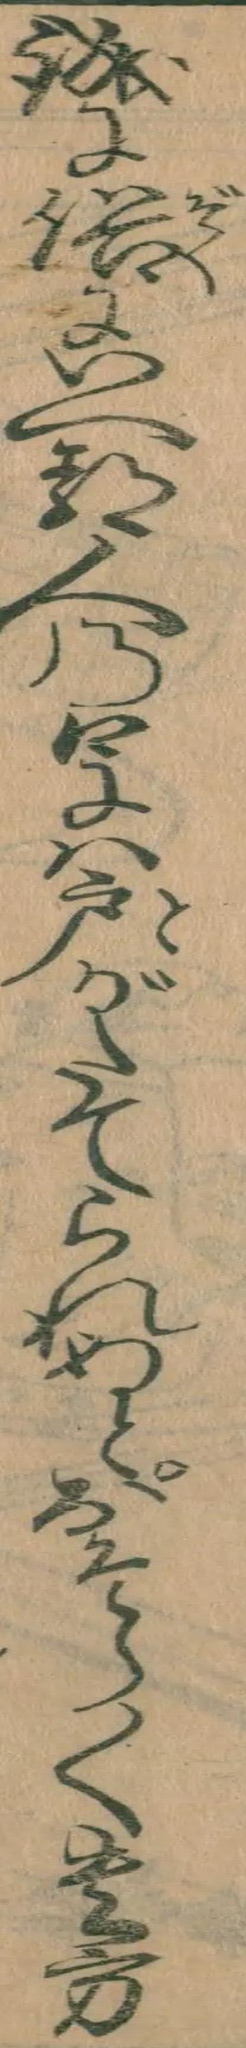誠に俗にいへる人の口には戸がたてられぬと。おそら〱貴方
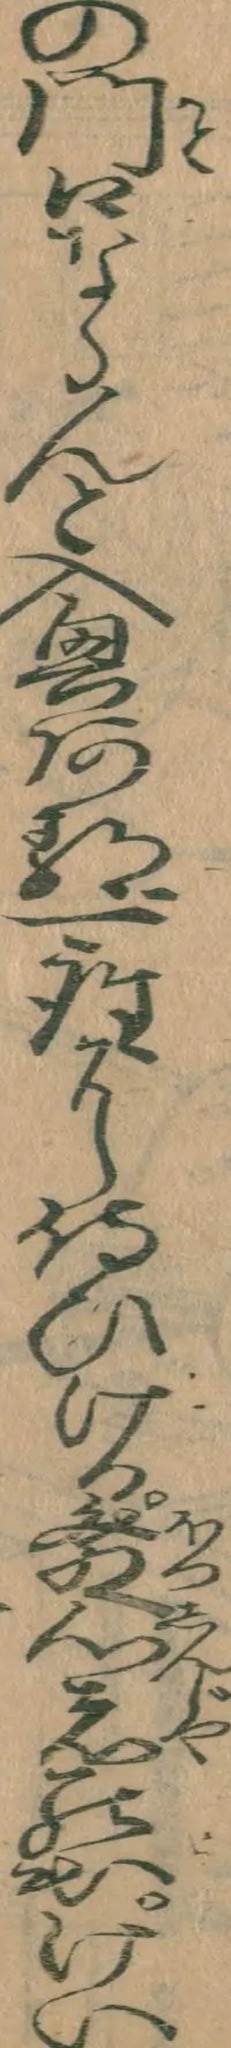の門口ならんと入興ある一座に侍ひける。発心者罷出。けい
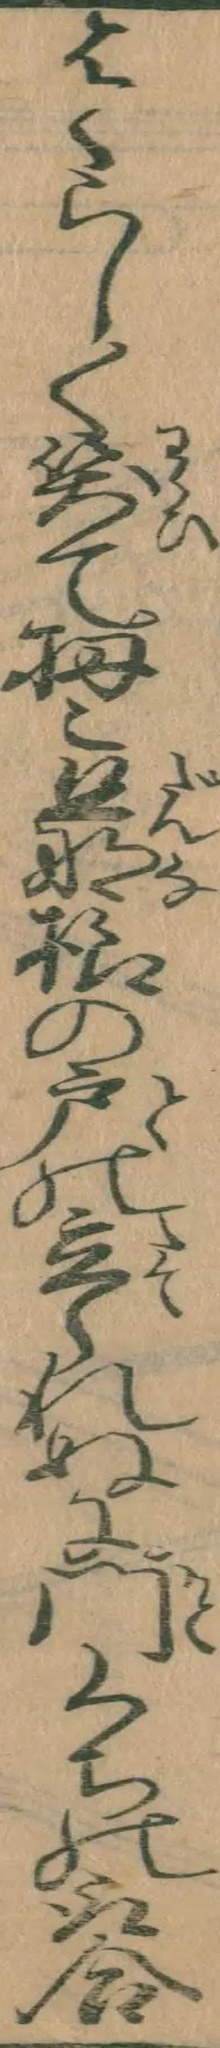はくらしく笑て扨々旦那様の戸の立られぬに。門くちの取合
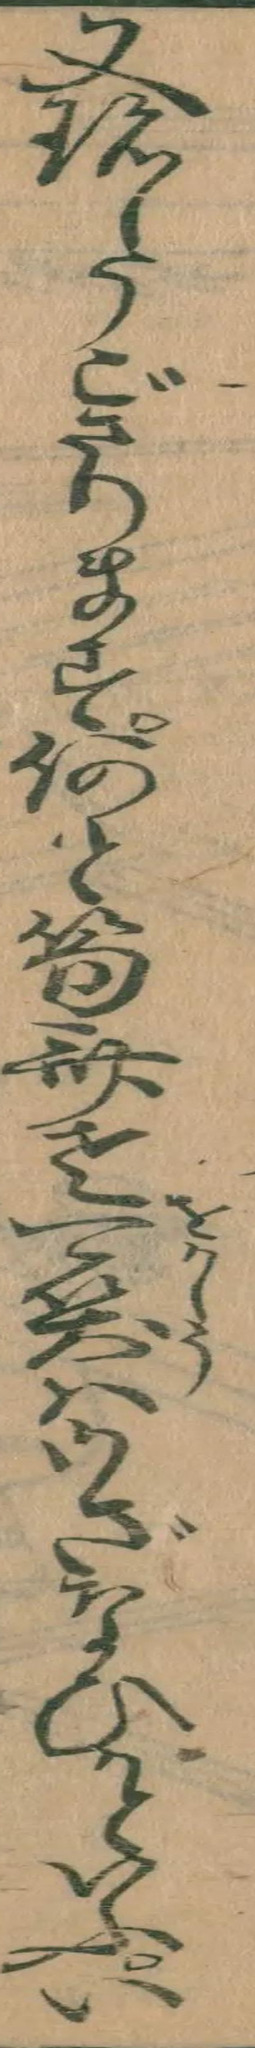又珍しうごさります。何と筍斎老可笑は御ざなひかといふ。い
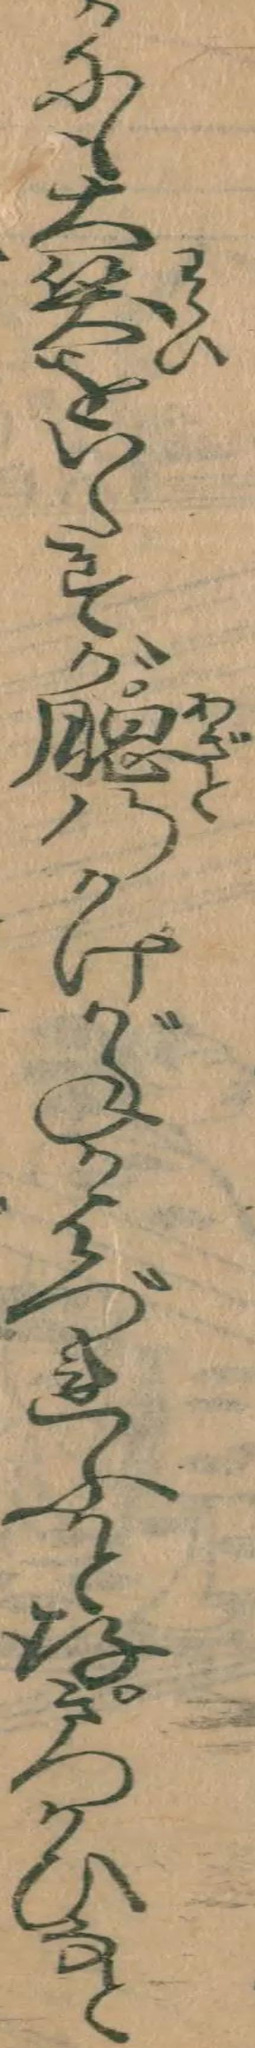かにも大笑をいたすが。腮のかけがねかはづれふかと存。きつかひなと
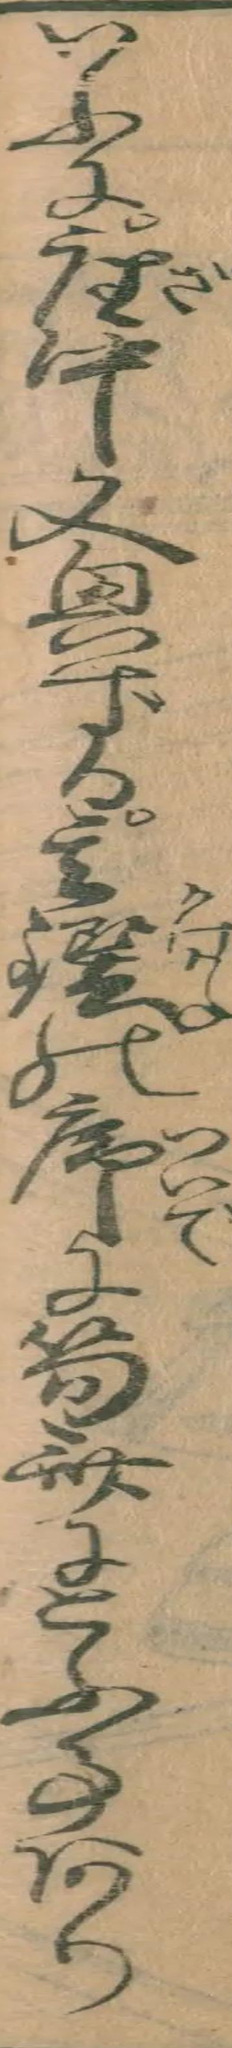いふに。座中又興ずる。其鐉の序に筍斎にとふ事あり
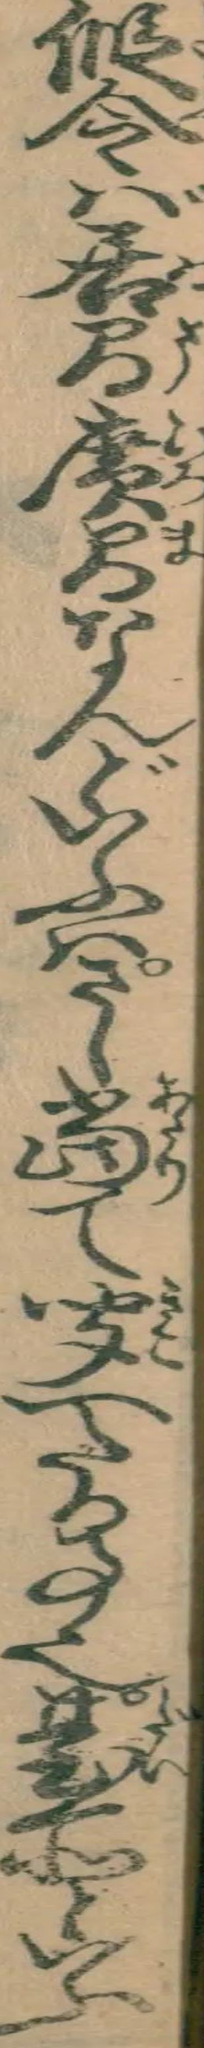仮令ば居間広間なんどいふは。さし当て聞へたる事也。台所といふ
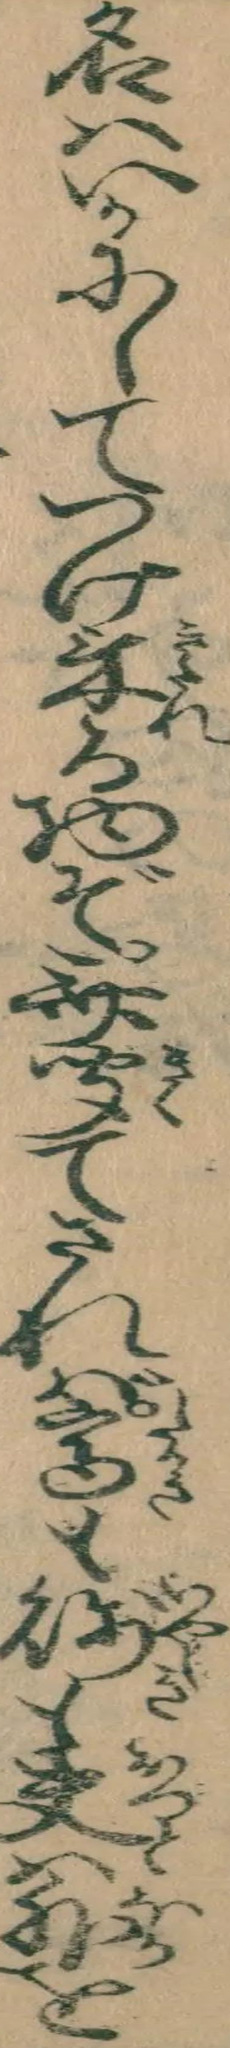名はいかにしてつけ来る物ぞ。斎聞てされば。高も賤も夫は外を
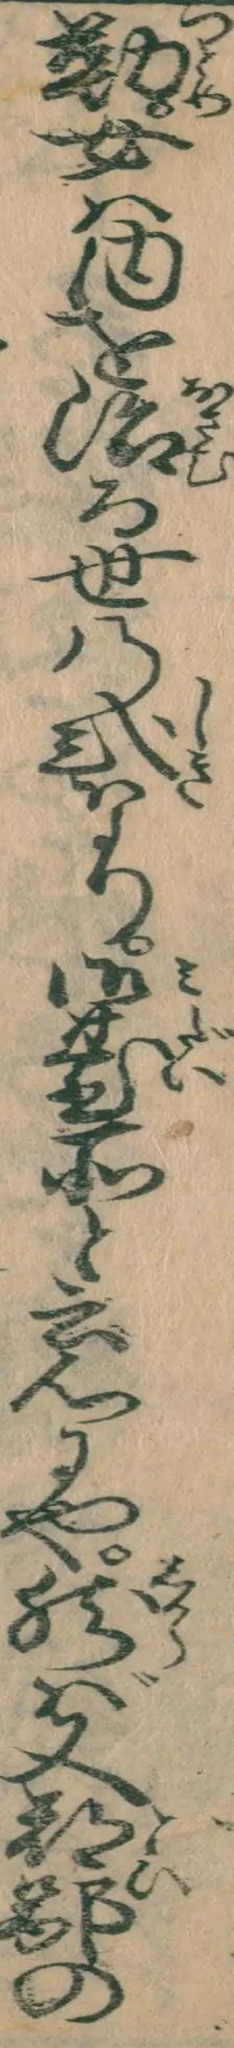勤。女は内を治る世の式なり。御台所と云心にや。然ば又都鄙の
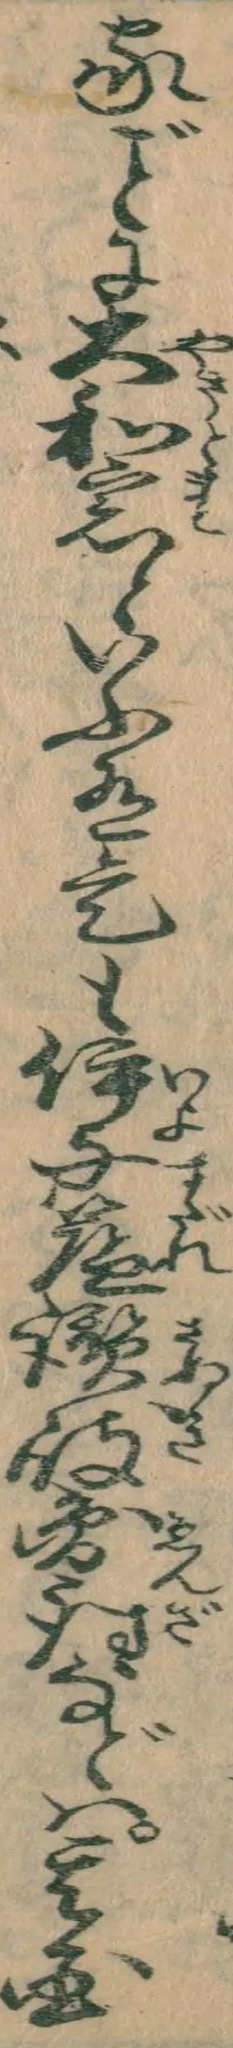家ごとに大和窓といふ有是も伊子簾讃岐円座などは。其国
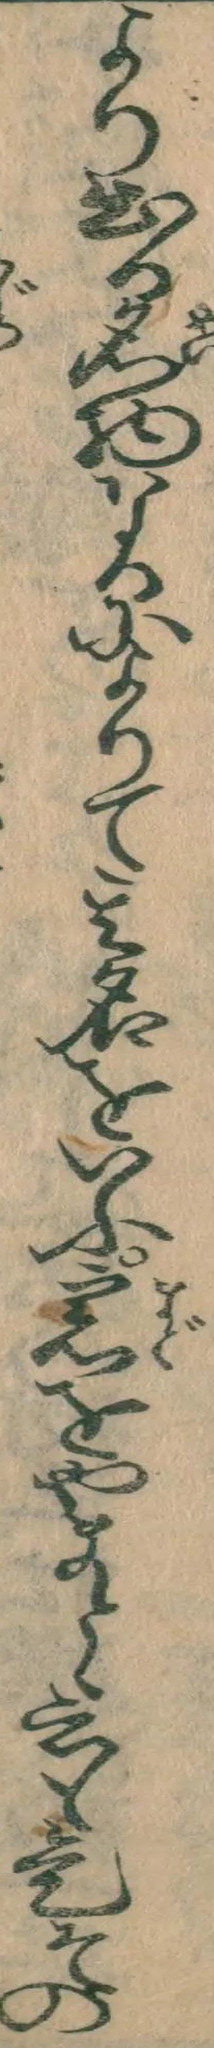より出る名物なるによりて其名をいふ。窓をやまとゝ云も是その
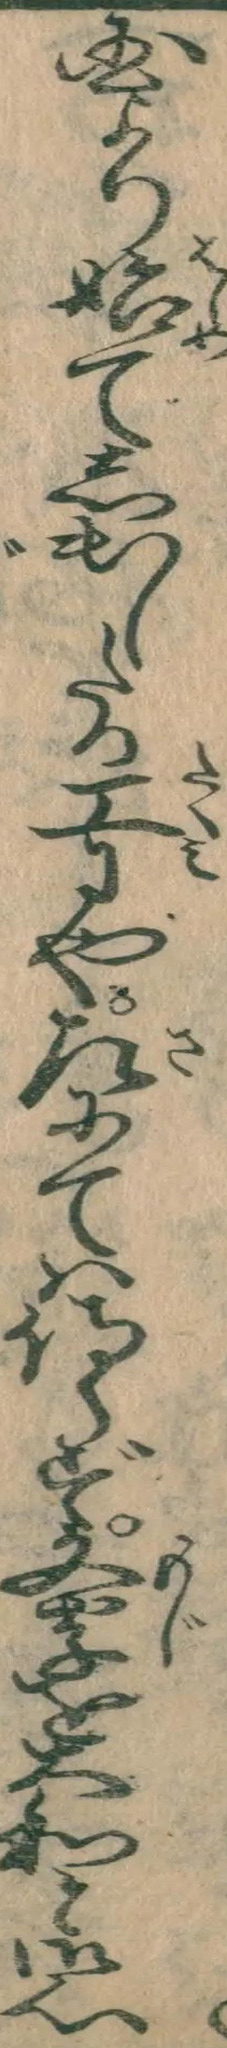国より始てし出したる工にや。左にては侍らず。文字を大和と御心
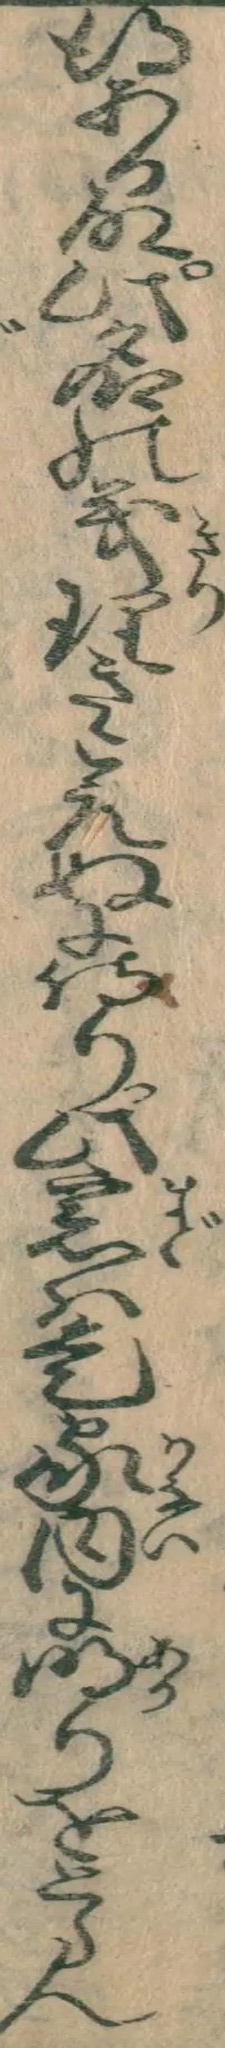得ある故。此名の義理きこえぬに侍り。此窓は是家内に明りをとらん
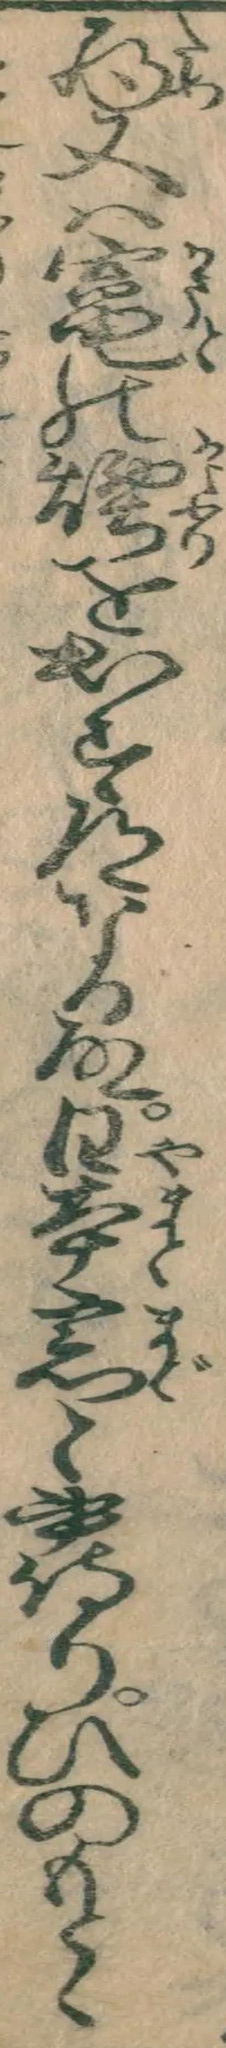為又は竃の煙を出す道なる故。日本窓と書侍り。ひのもとゝ
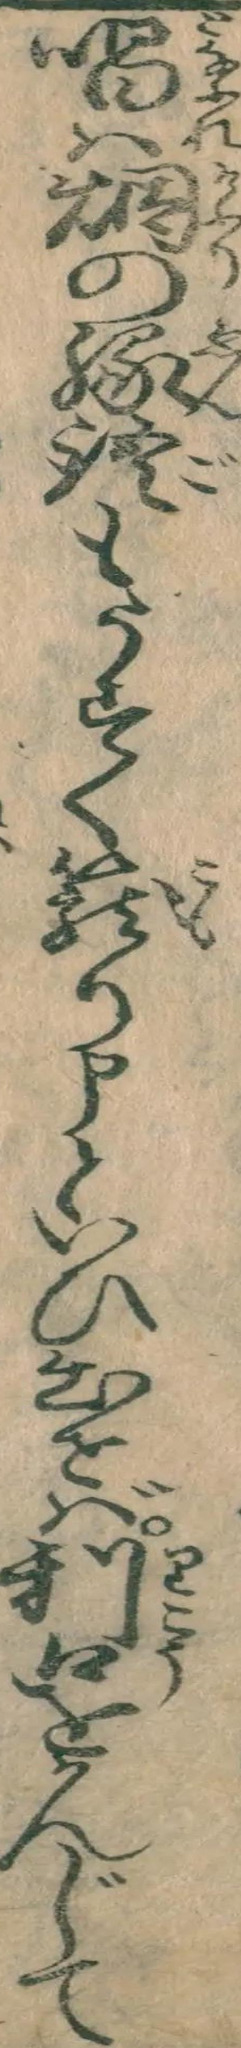唱は煙の縁語もうすく篭り申といひ出をば。利口をかんじて
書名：新竹斎 5巻
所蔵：国立国会図書館 National Diet Library, JAPAN
